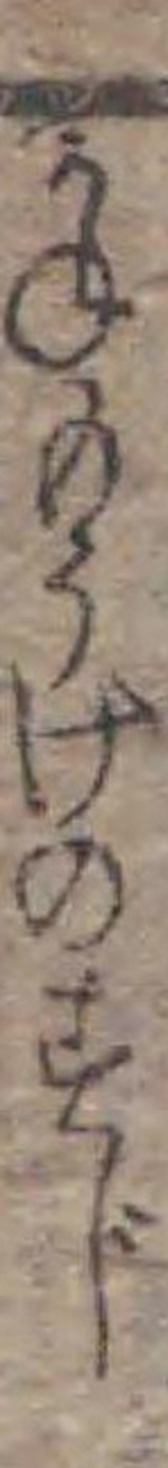かねもうけのすじ
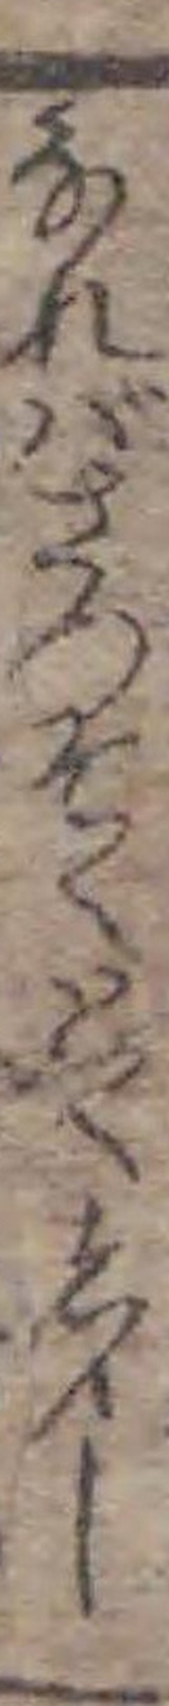なればさつそくとくしんし
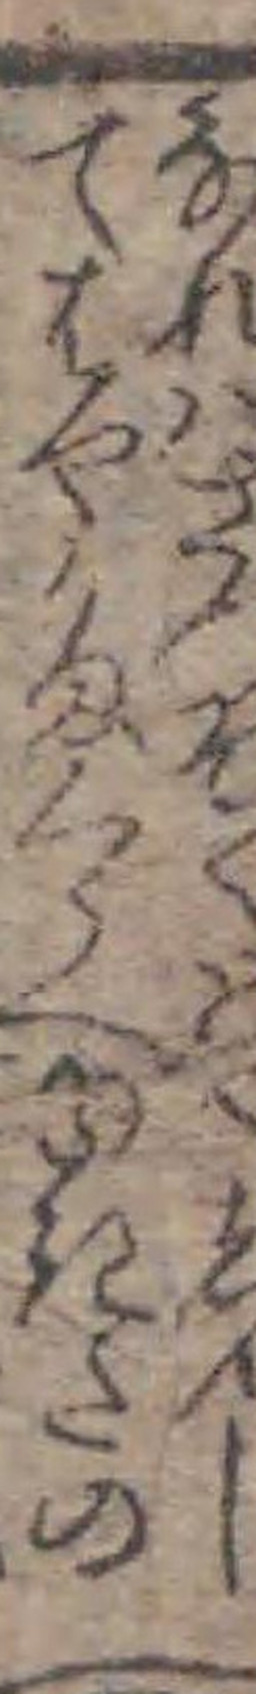てはやかまくらへゆきたの
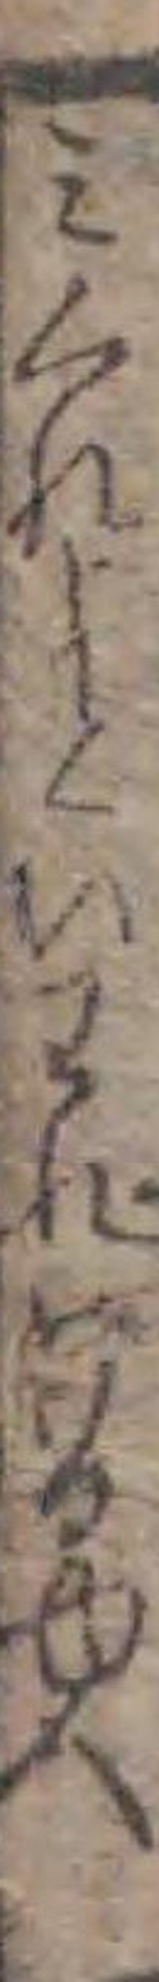みくれよといわれけるゆへ
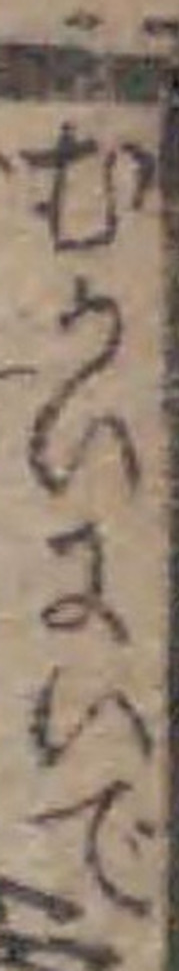むかいにいで
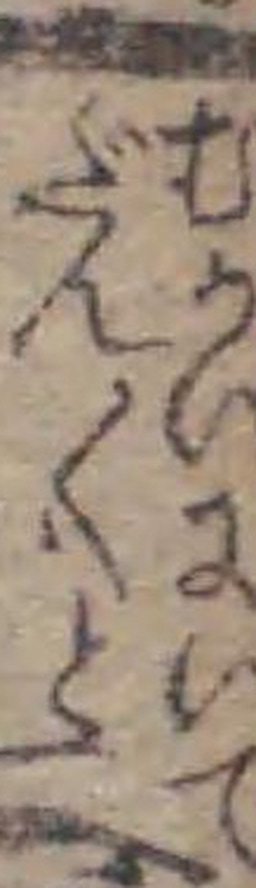だん〴〵と
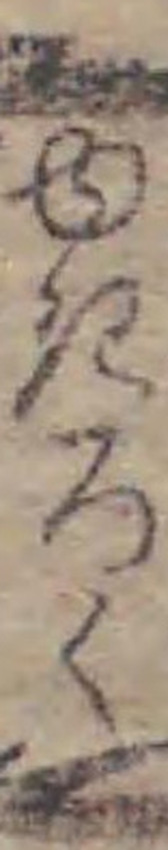ゆきろく
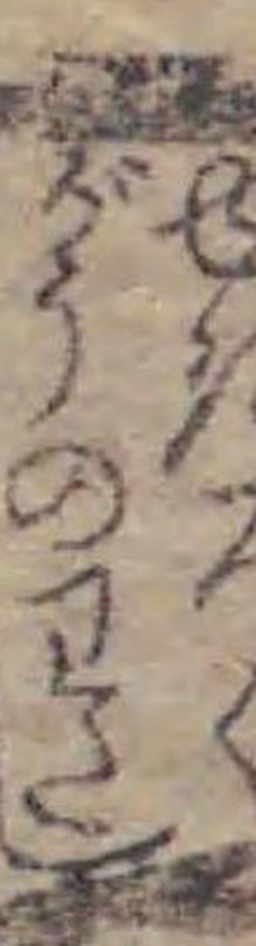がうのわたし
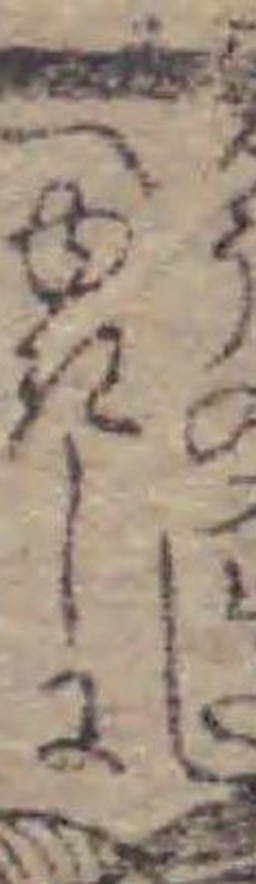へゆきしに
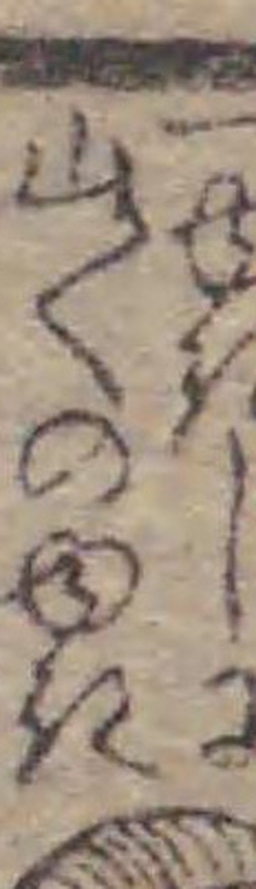山〳〵のゆき
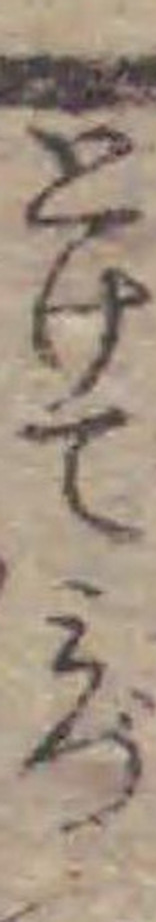とけてみづ
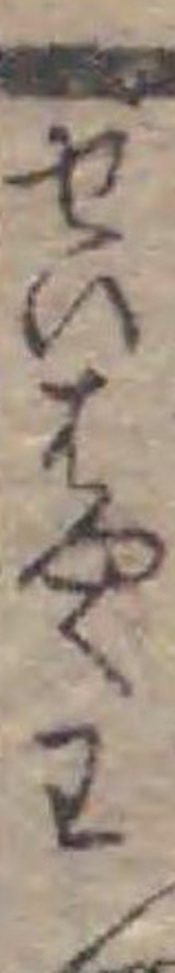せいはやくわ
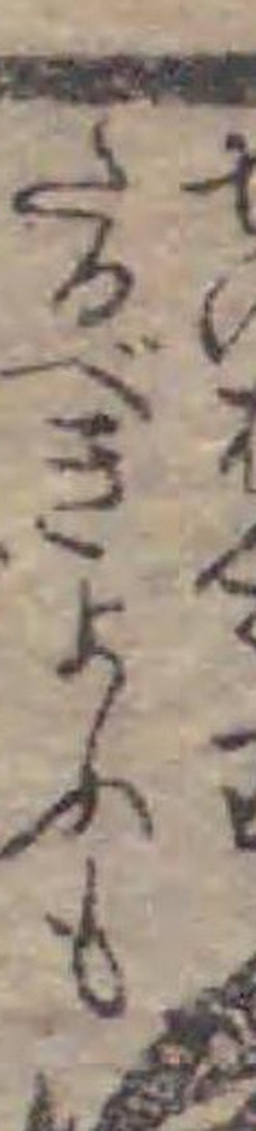たるべきよふも
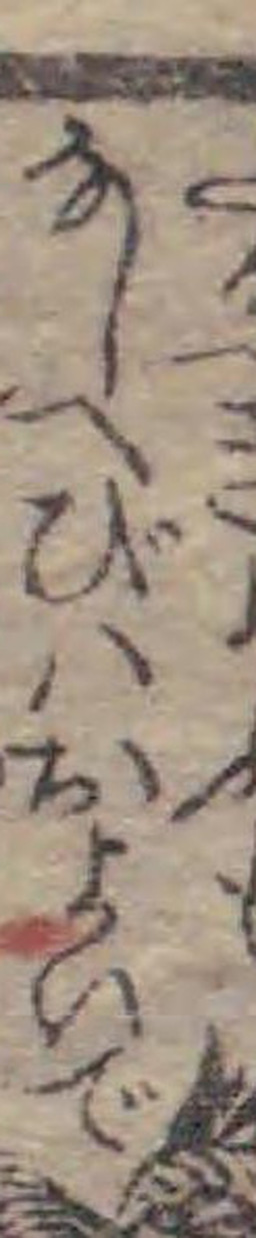なしへびはおよいで
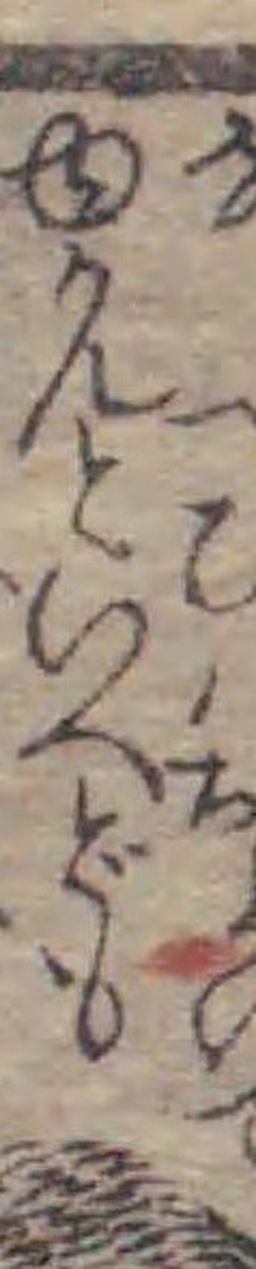ゆかんといへども
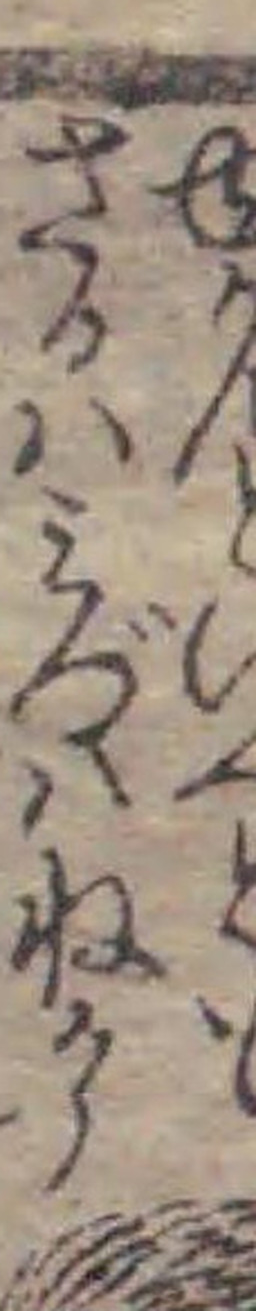さるはみづはねから
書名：化物七段目 : 2巻
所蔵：国立国会図書館 National Diet Library, JAPAN
